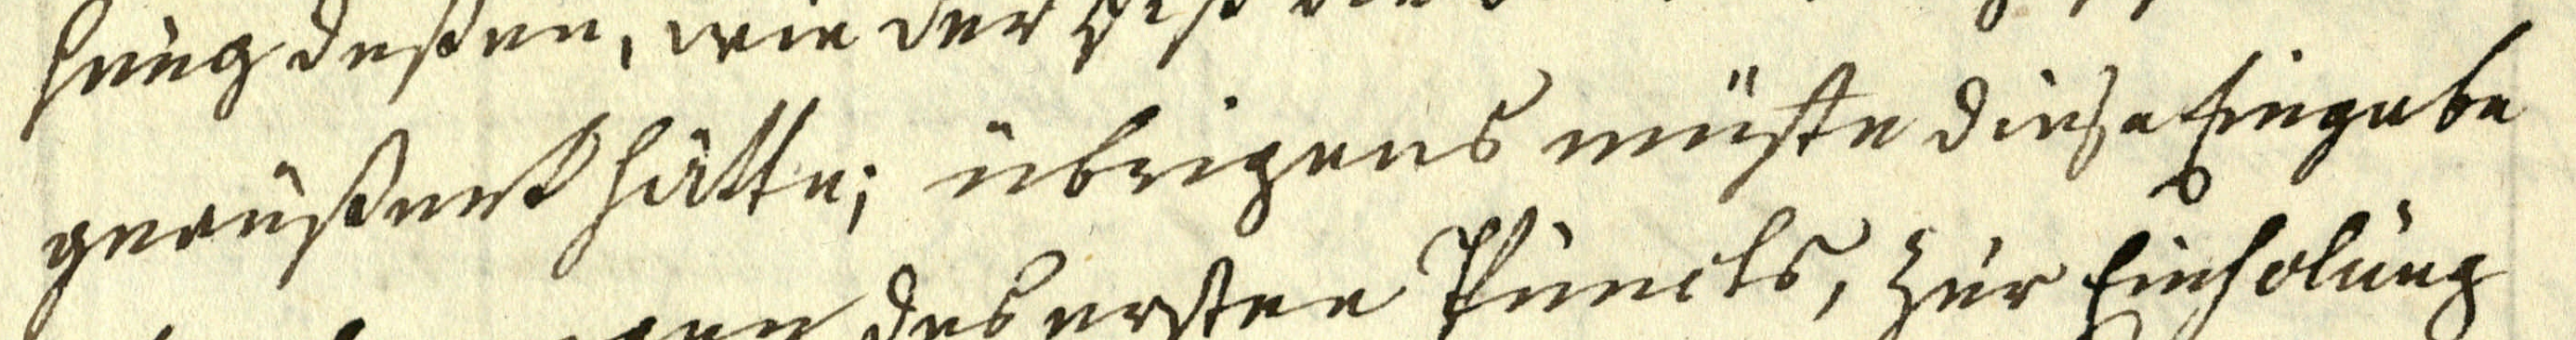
geäußert hätte; übrigens müste diese Eingabe
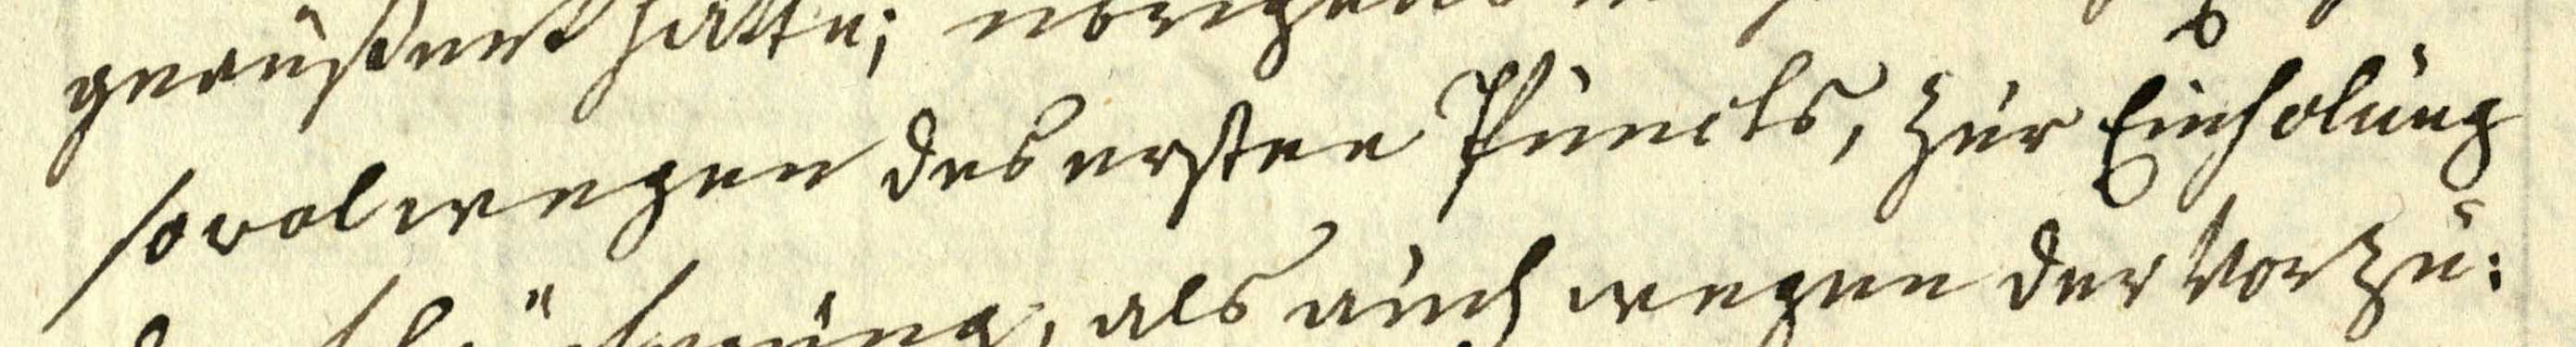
so wol wegen des ersten Puncts, zur Einholung
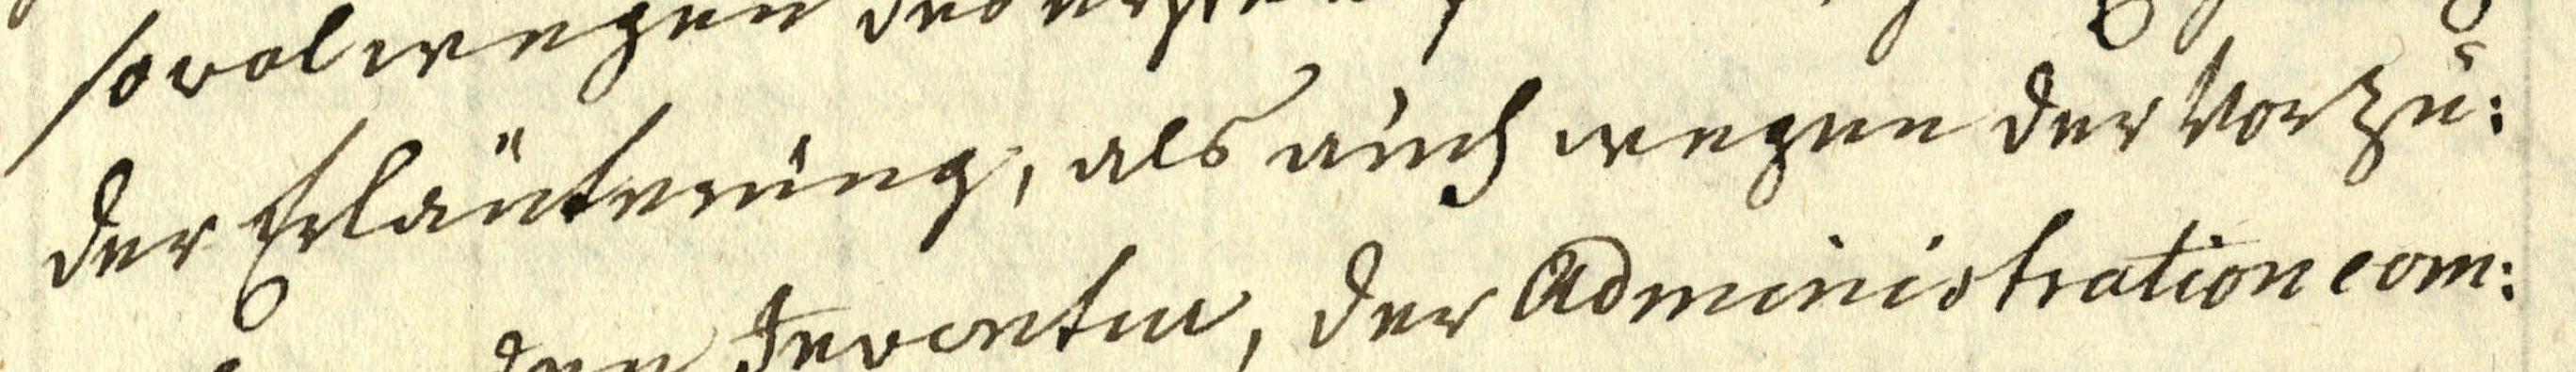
der Erläuterung, als auch wegen der vorzu¬
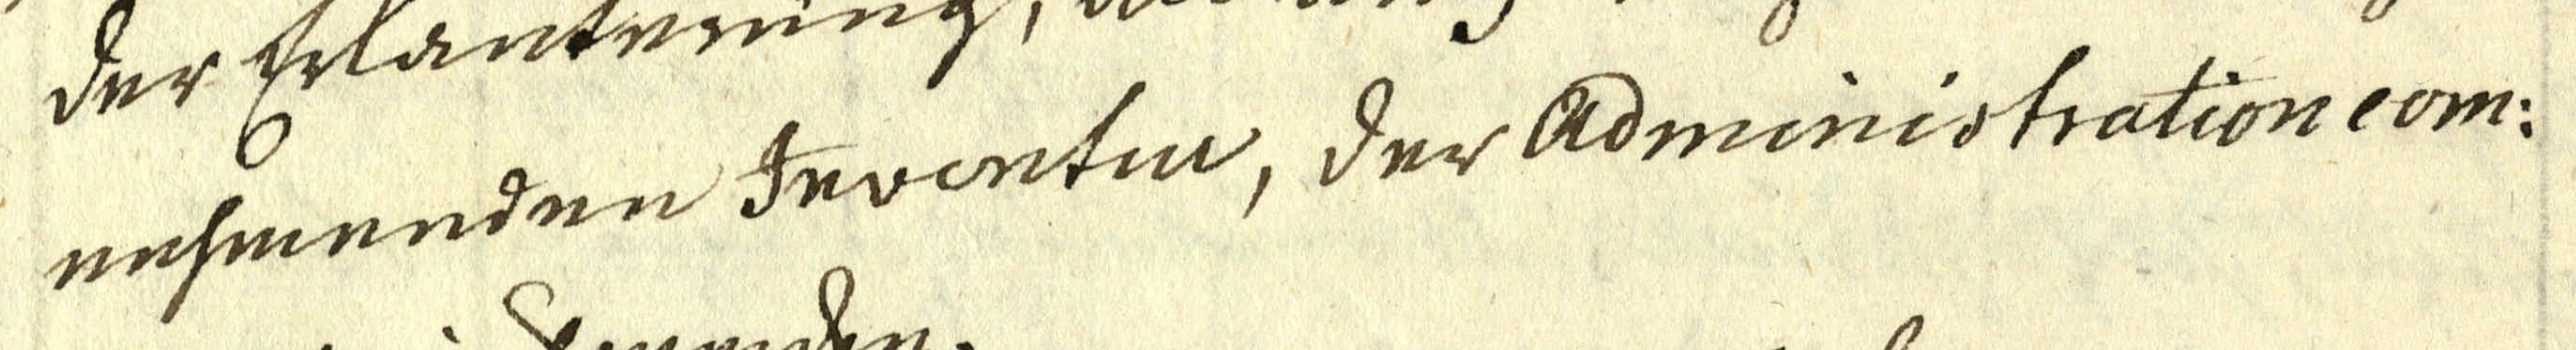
nehmenden Inventur, der Administration com¬
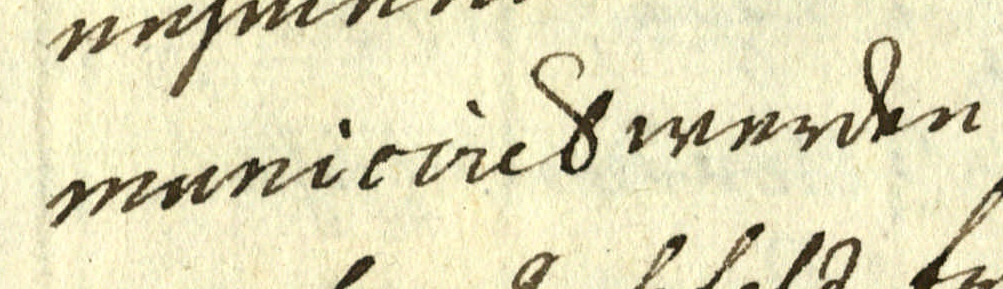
municiret werden.
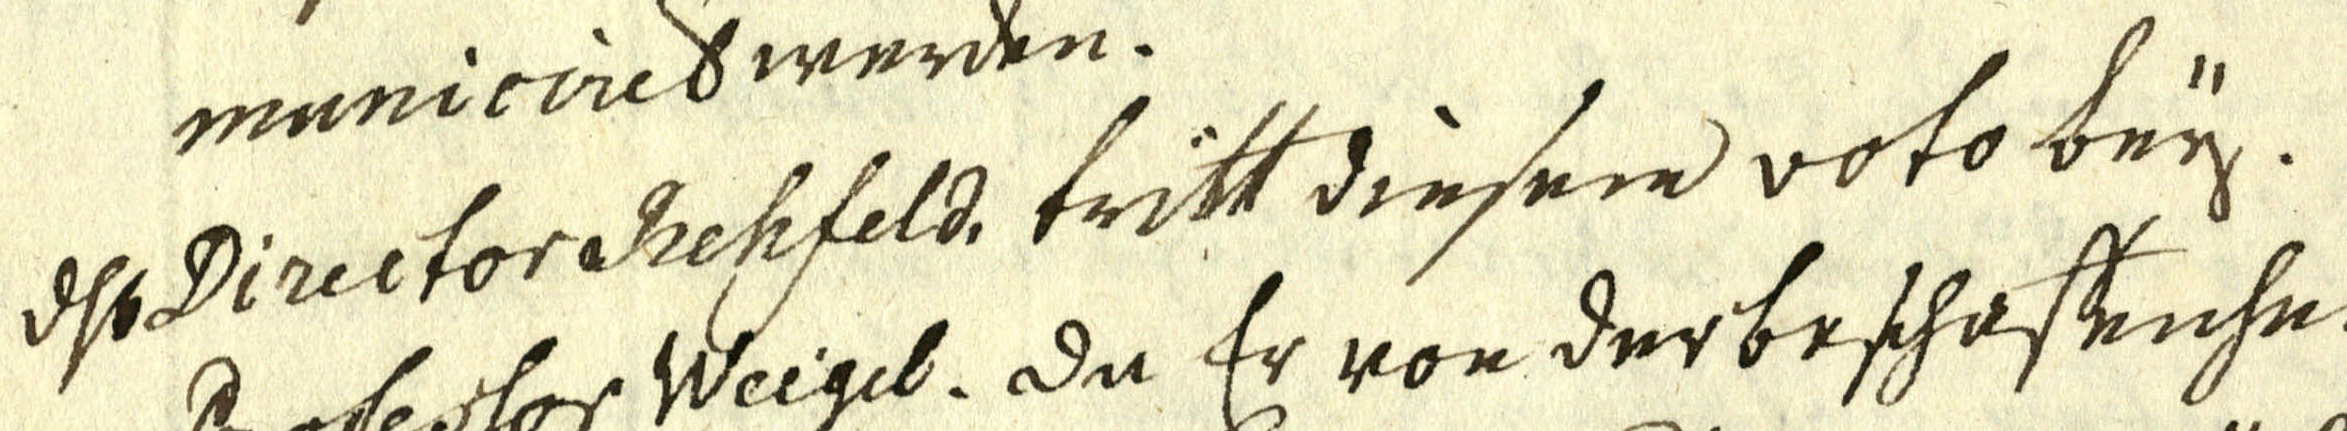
dh. Director Rehfeld. tritt diesem voto beÿ.
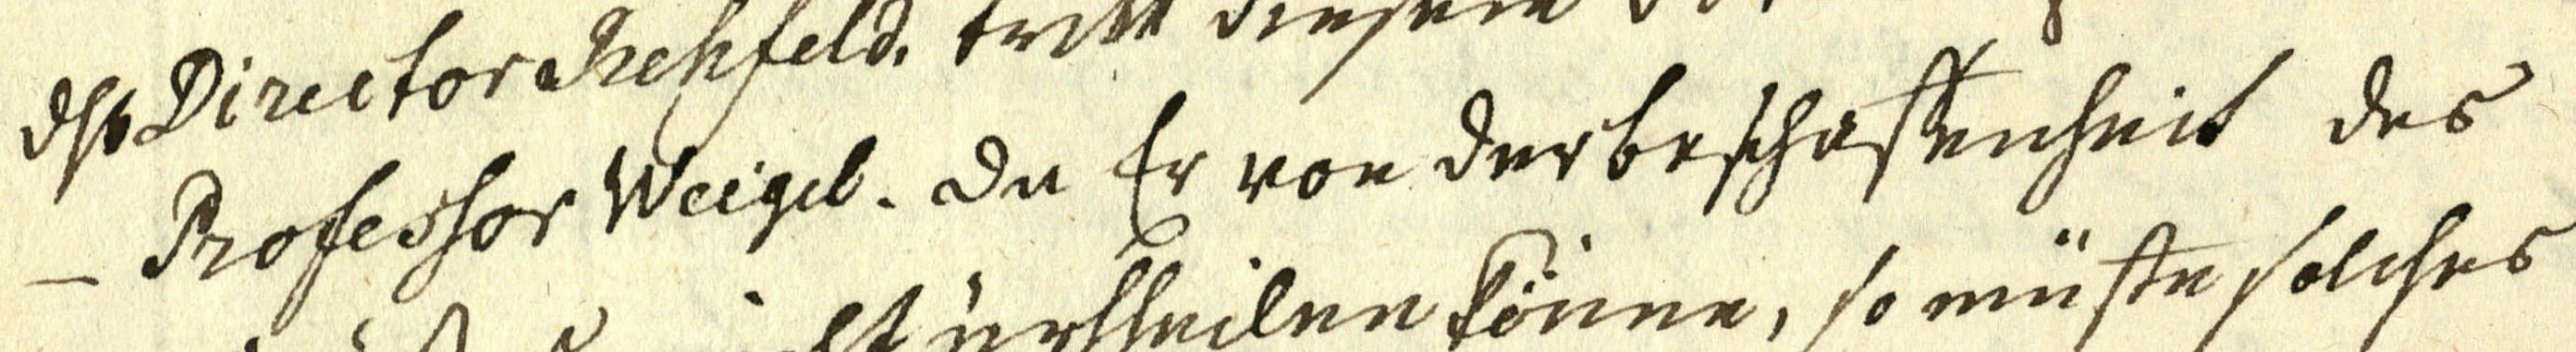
Professor Weigel. Da Er von der Beschaffenheit des
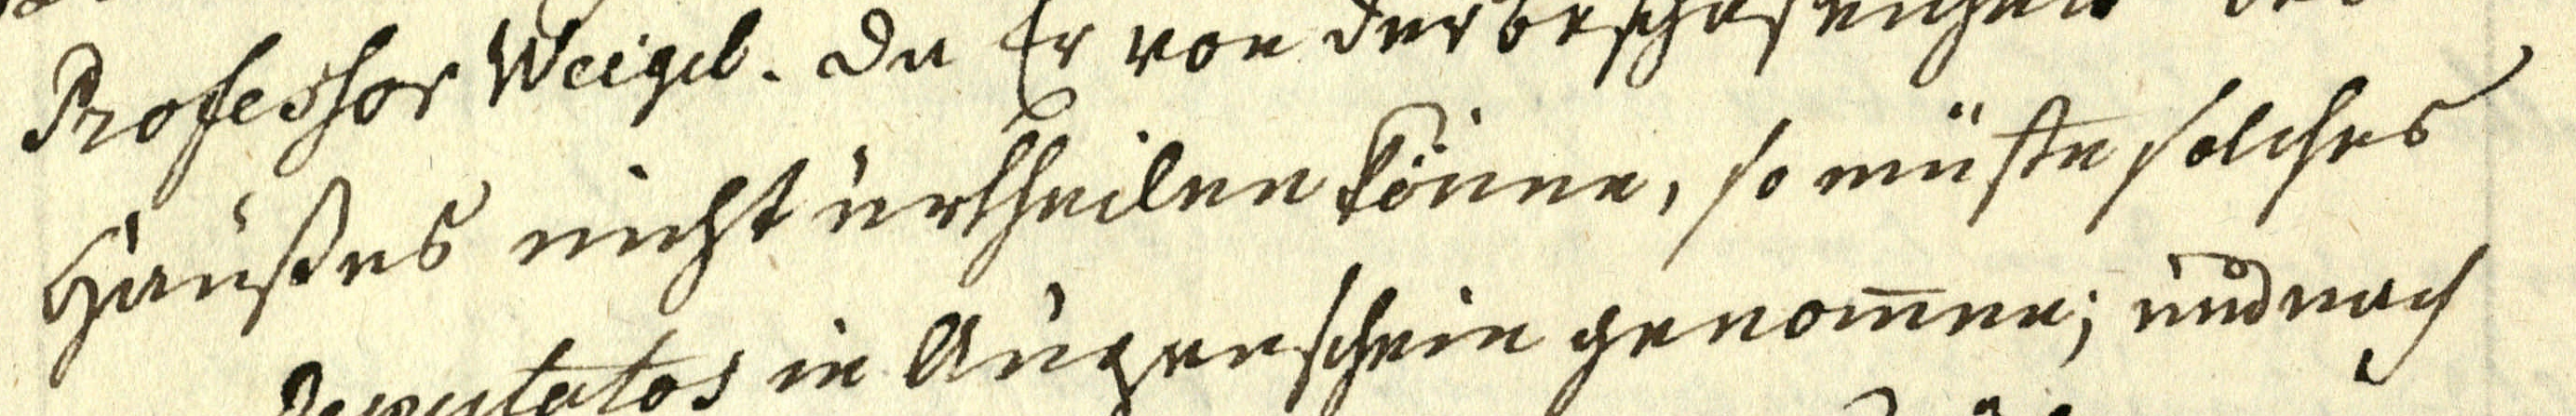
Haußes nicht urtheilen könne, so müste solches
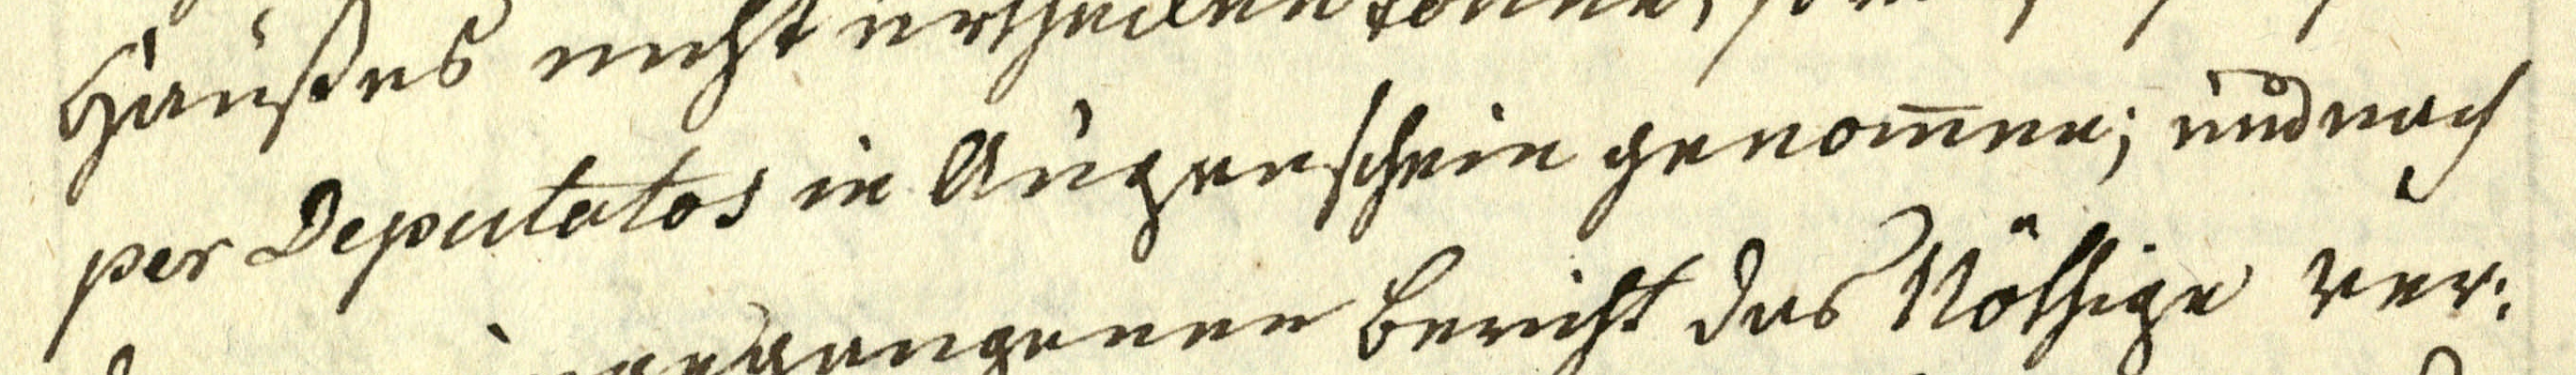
per Deputatos in Augenschein genomen; und nach
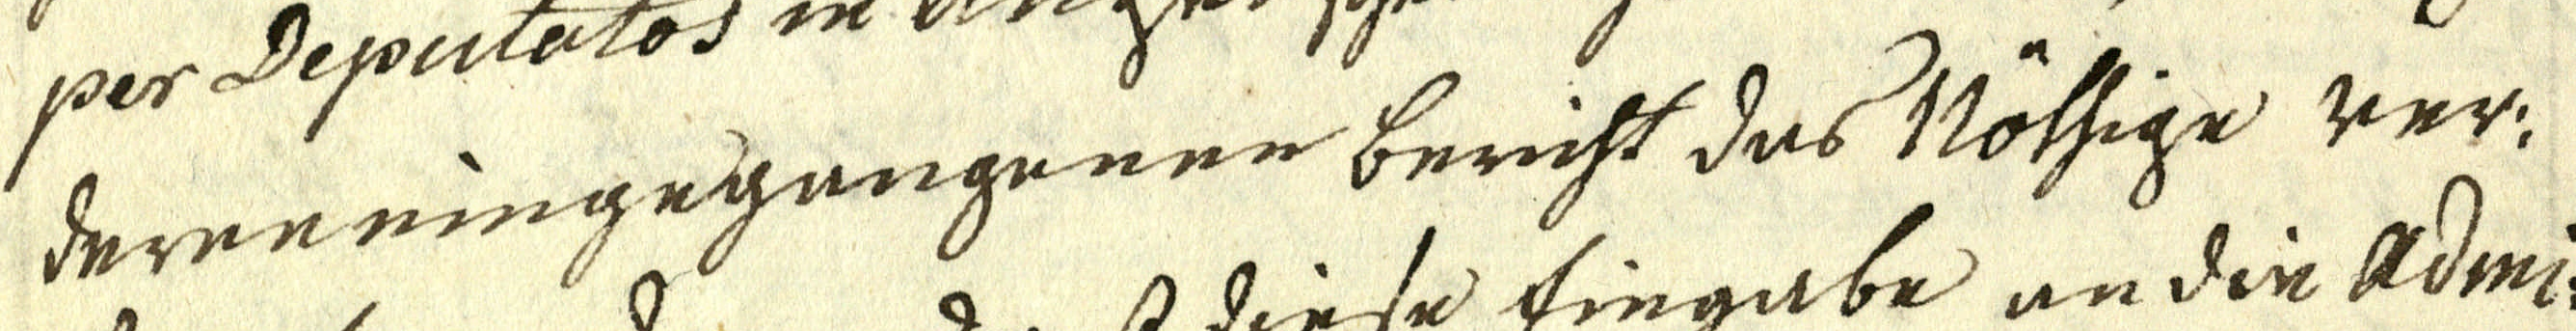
deren eingegangenen Bericht das Nöthige ver¬
